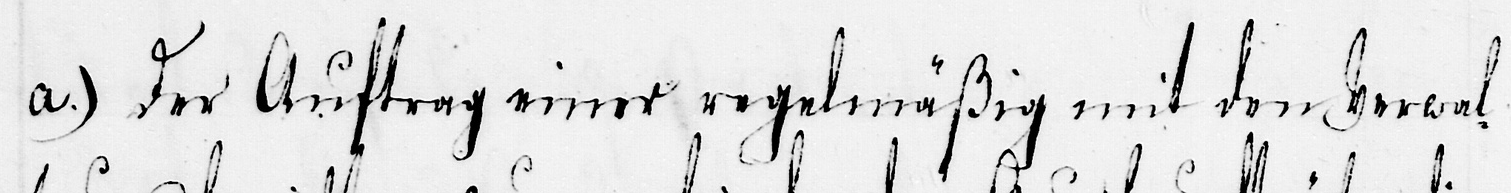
a.) Der Auftrag einer regelmäßig mit den Verwal¬
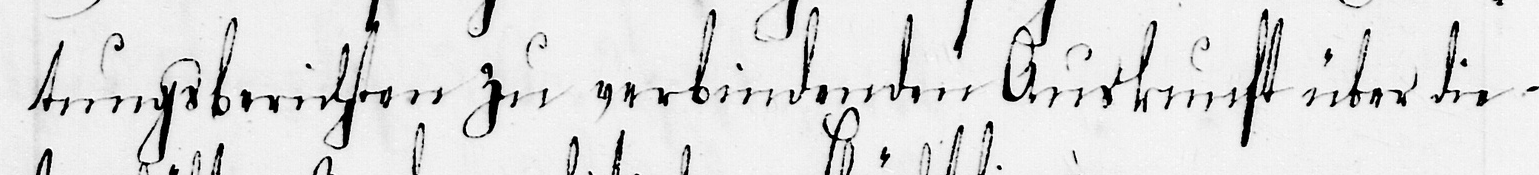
tungsberichten zu verbindenden Auskunft über die
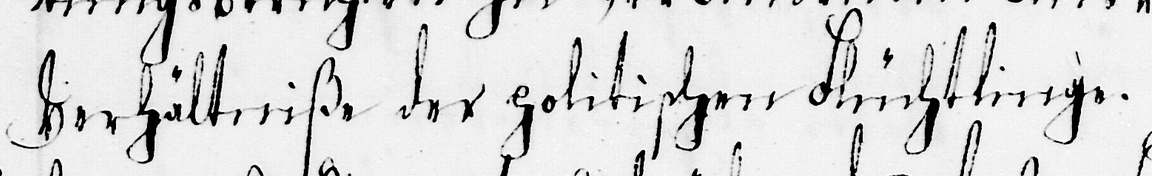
Verhältniße der politischen Flüchtlinge.
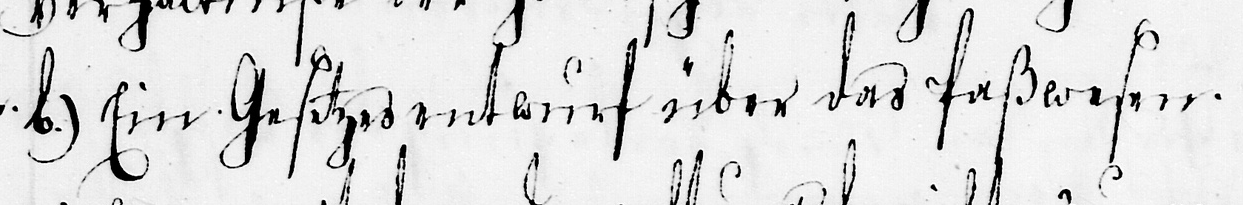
b.) Ein Gesetzesentwurf über das Paßwesen.
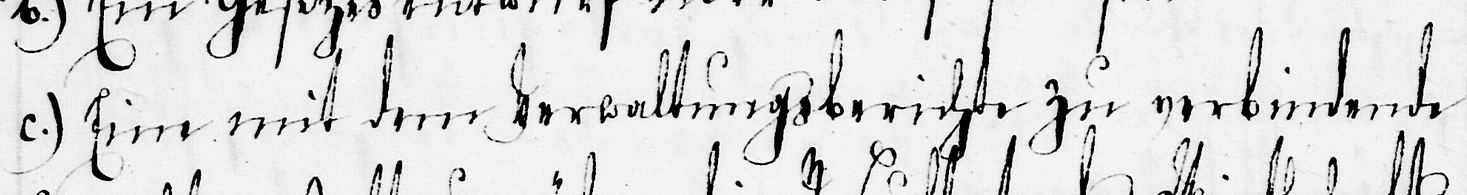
c.) Eine mit dem Verwaltungsberichte zu verbindende
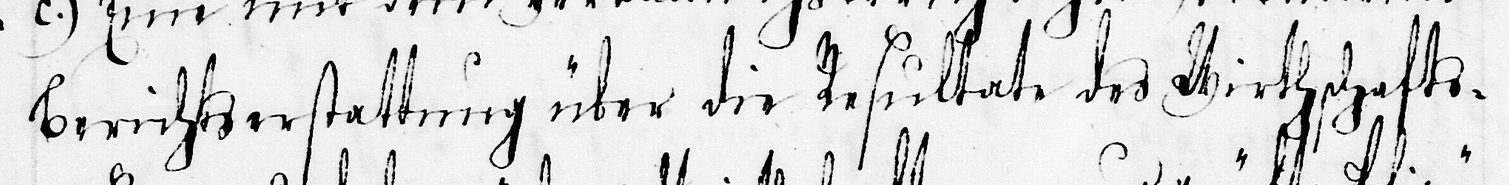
Berichtserstattung über die Resultate des Wirthschafts¬
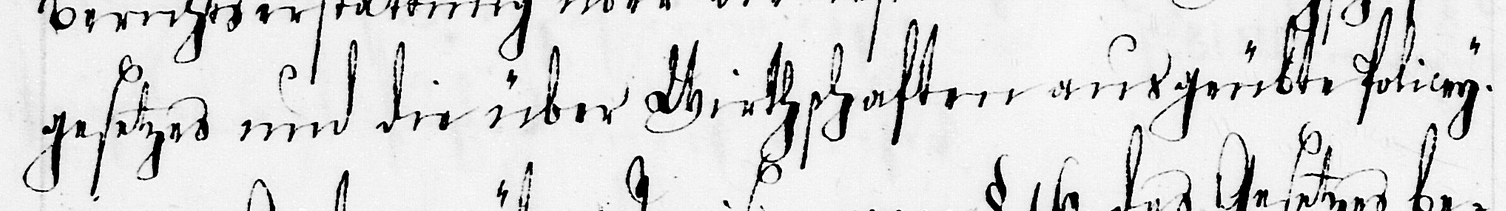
gesetzes und die über Wirthschaften ausgeübte Policey.
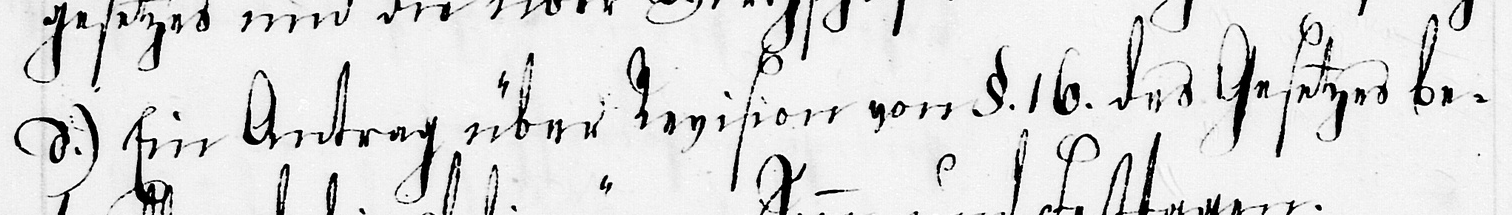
d.) Ein Antrag über Revision von §. 16. des Gesetzes be¬
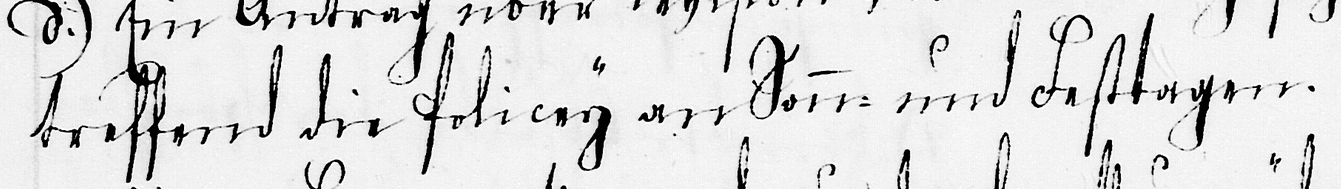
treffend die Policey an Sonn- und Festtagen.
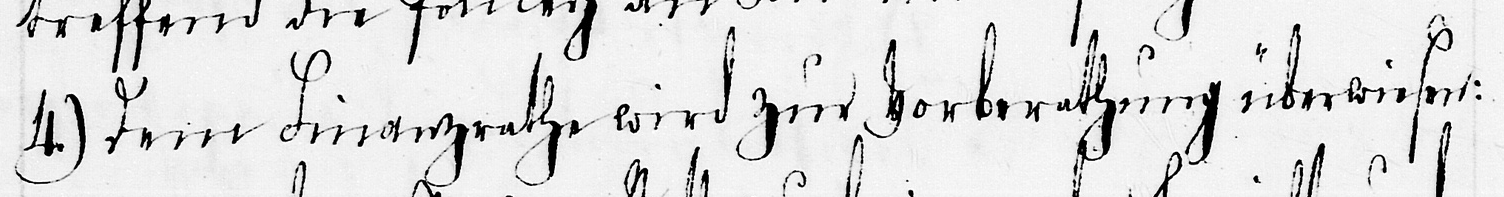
4.) Dem Finanzrathe wird zur Vorberathung überwiesen:
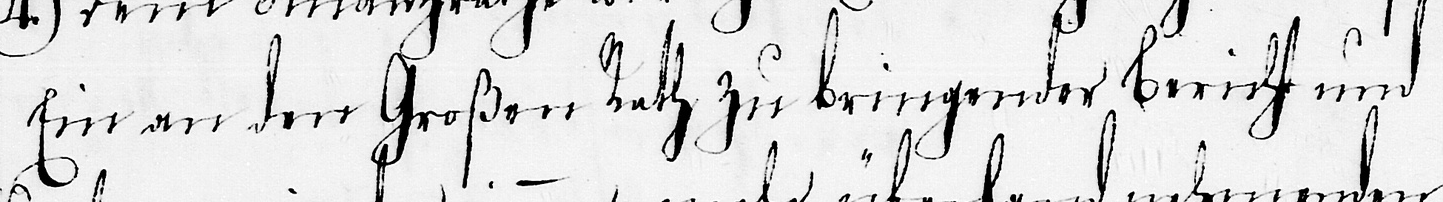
Ein an den Großen Rath zu bringender Bericht und
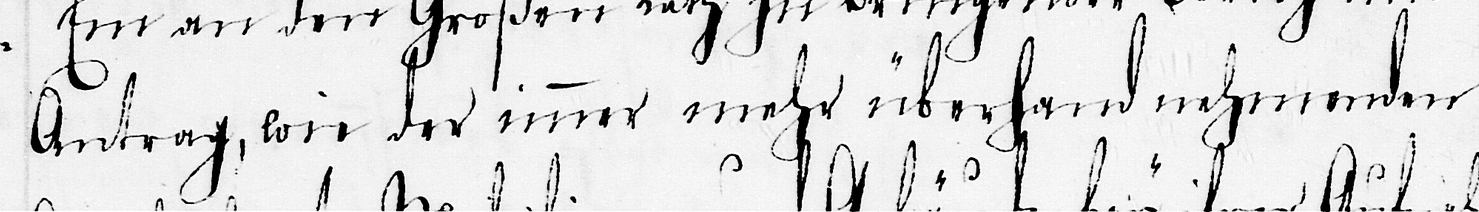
Antrag, wie der immer mehr überhand nehmenden
